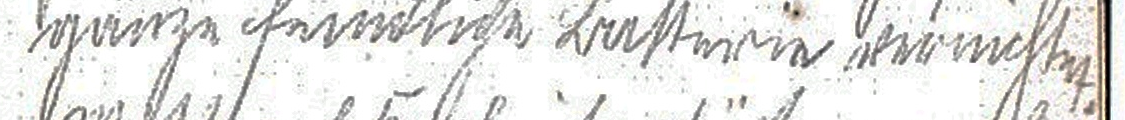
ganze feindliche Batterie vernichtet.
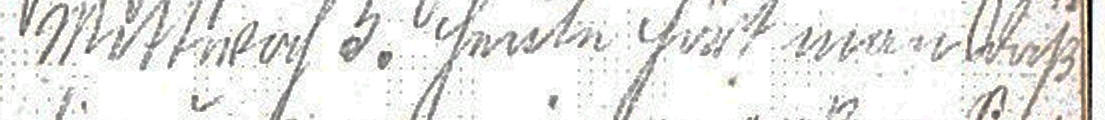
Mittwich 5. Heute hört man daß
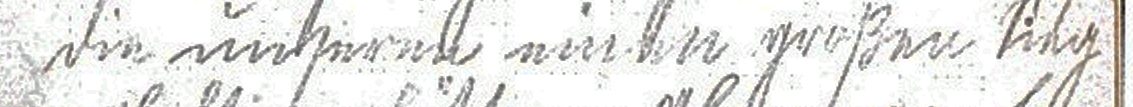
die unseren einen großen Sieg
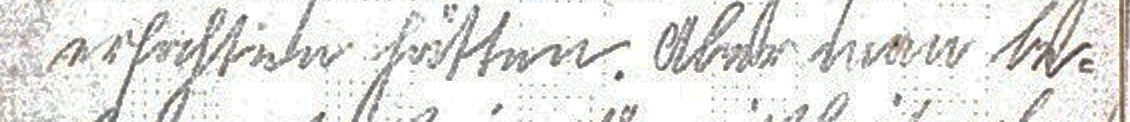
erfochten hätten. Aber man be-
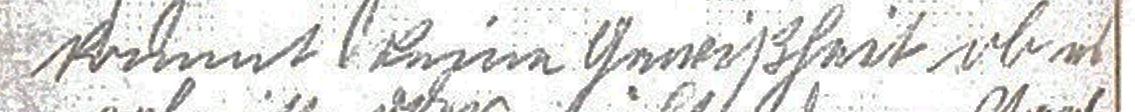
kommt keine Gewißheit ob es
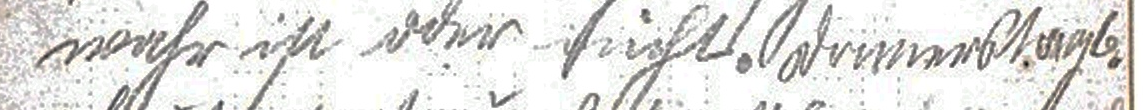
wahr ist oder nicht. Donnerstag 6.
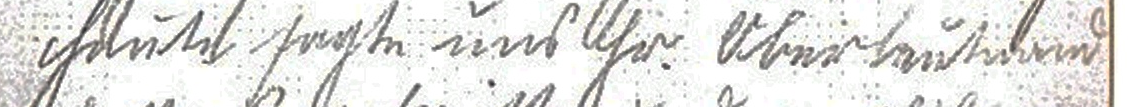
heute sagt uns Hr. Oberstleutnand
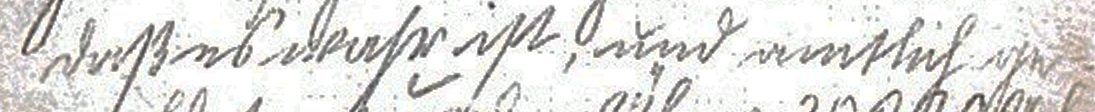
daß es waht ist , und amtlich ge
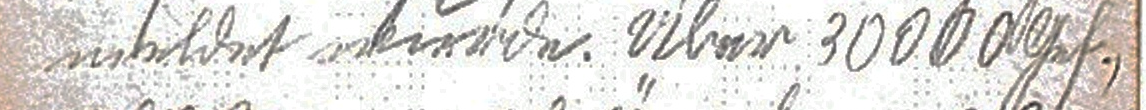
macht wurde. Über 30000 Gef.
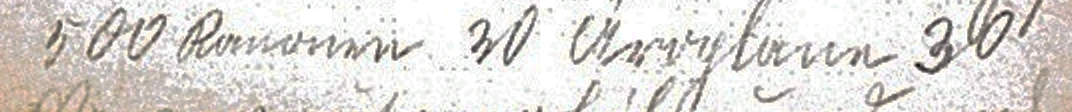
500 Kanonen 30 Äroplan 30
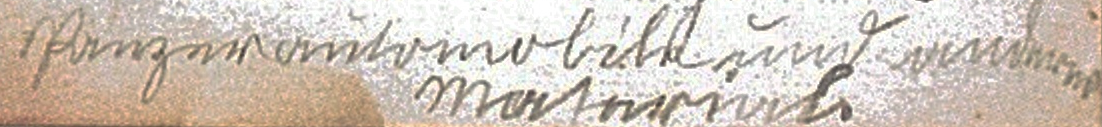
Panzerautomobile und anderes
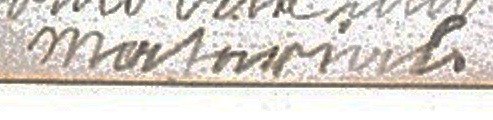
Material
